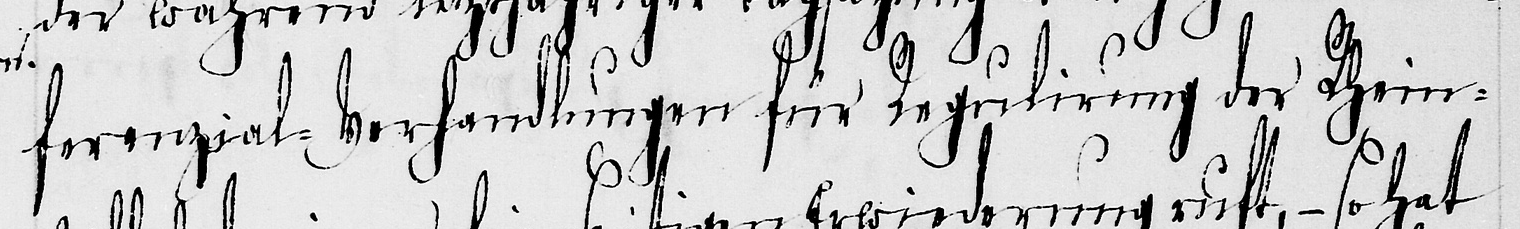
ferenzial-Verhandlungen für Regulierung der Rheins¬
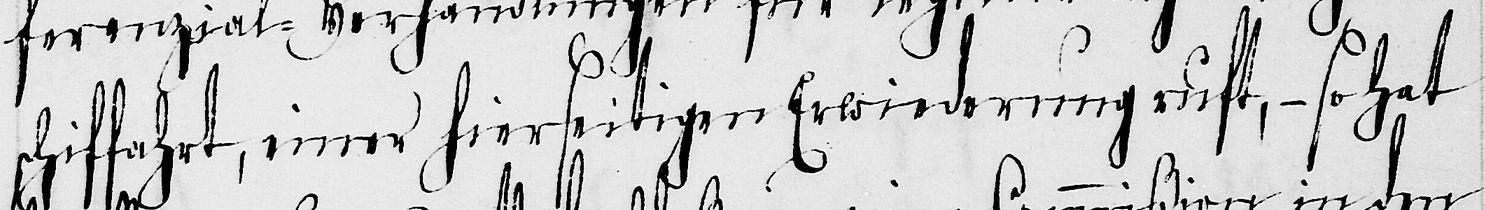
chiffahrt, einer hierseitigen Erwiederung ruft, – so hat
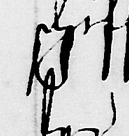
d.
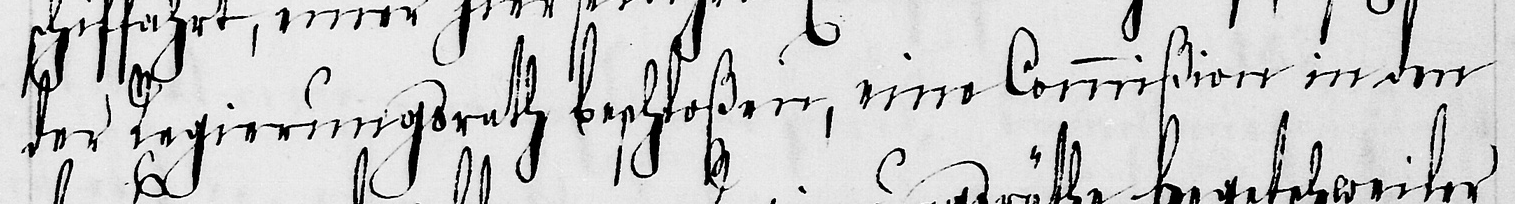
der Regierungsrath beschloßen, eine Commißion in den
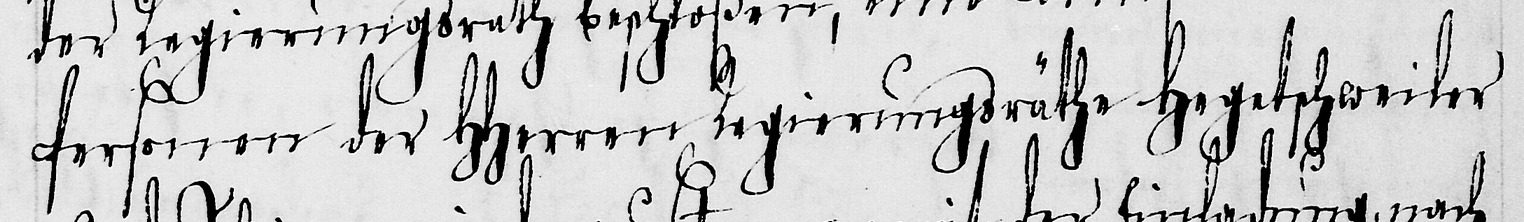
Personen der HHerren Regierungsräthe Hegetschweiler
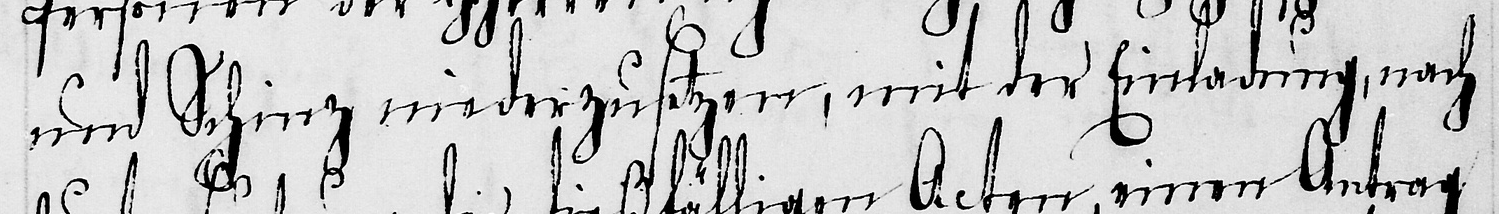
und Schinz niederzusetzen, mit der Einladung, nach
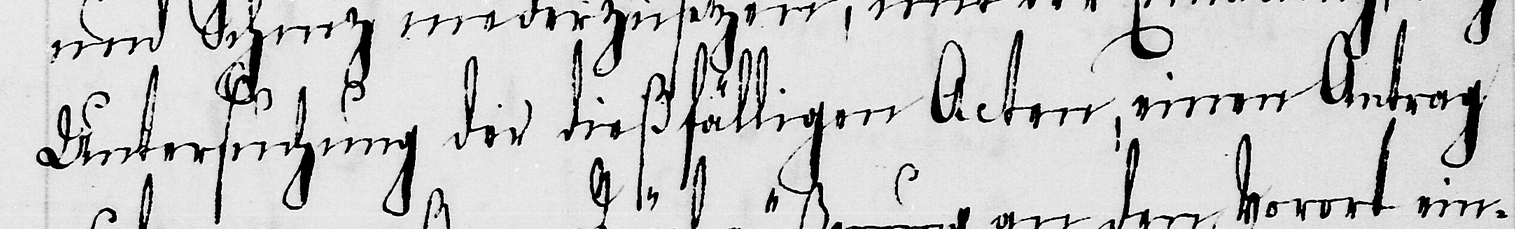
Untersuchung der dießfälligen Acten, einen Antrag
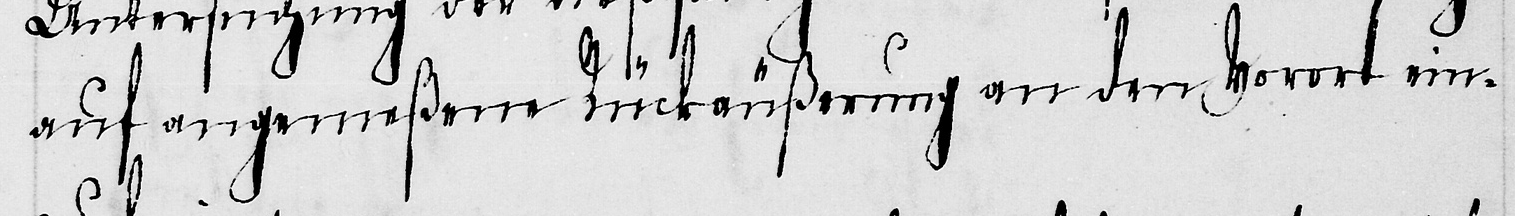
auf angemeßene Rückäußerung an den Vorort ein¬
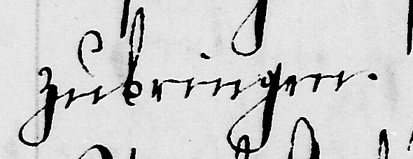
zubringen.
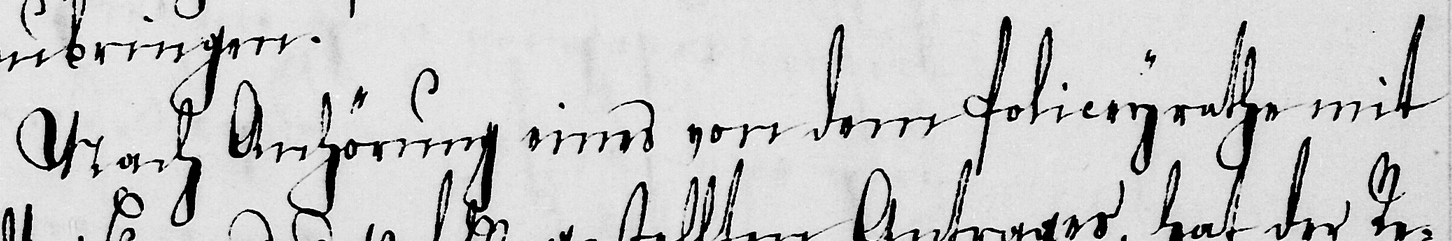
Nach Anhörung eines von dem Policeyrathe mit
